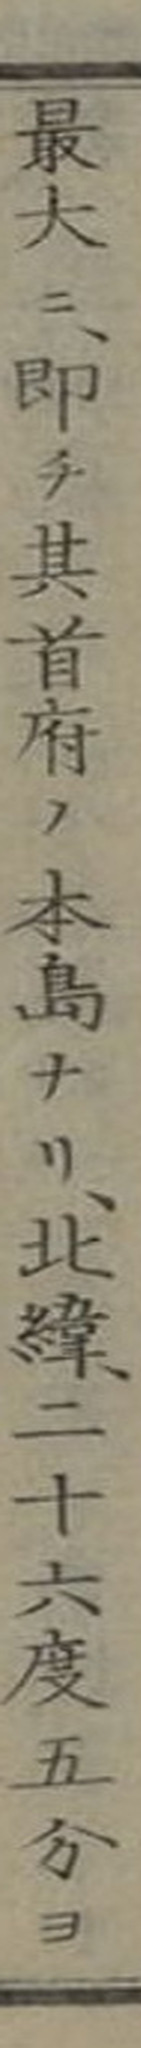最大ニ、即チ其首府ノ本島ナリ、北緯、二十六度五分ヨ
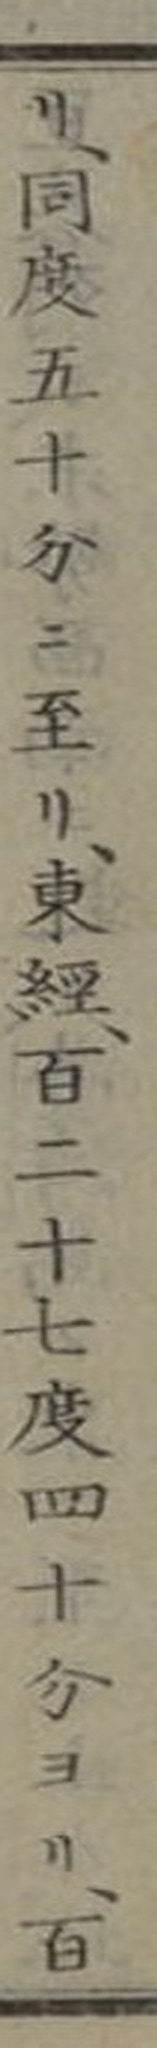リ、同度五十分ニ至リ、東経、百二十七度四十分ヨリ、百
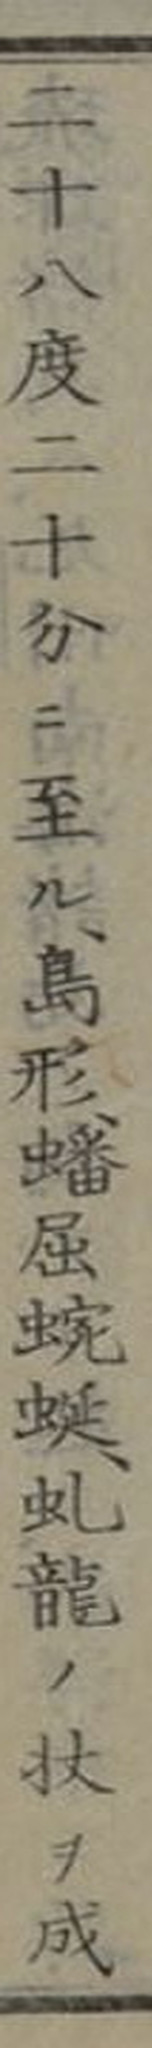二十八度二十分ニ至ル、島形、蟠屈蜿蜒、虬竜ノ状ヲ成
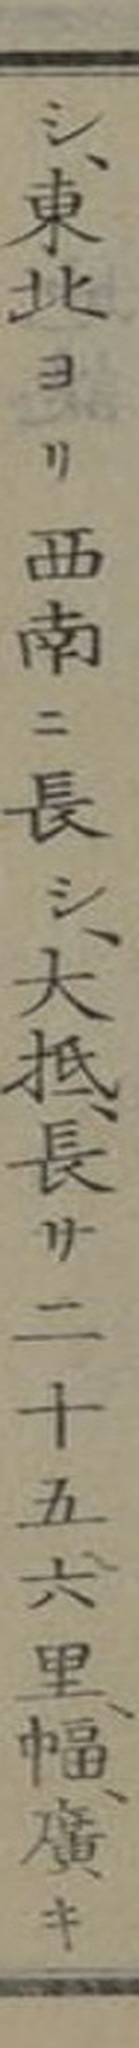シ、東北ヨリ西南ニ長シ、大抵、長サ二十五六里、幅、広キ
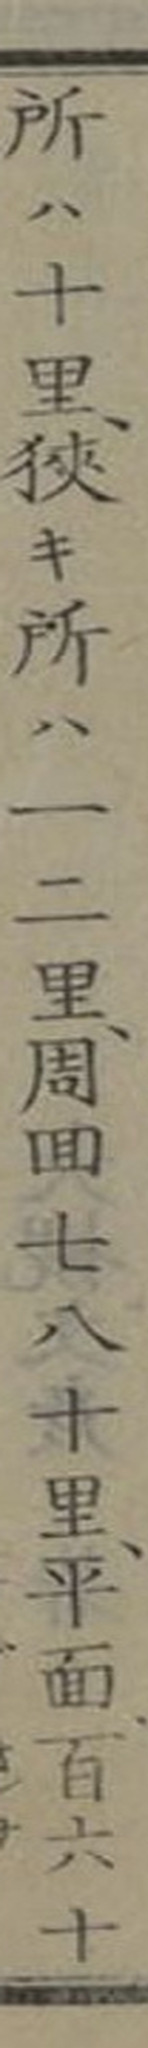所ハ十里、狭キ所ハ一二里、周回七八十里、平面百六十
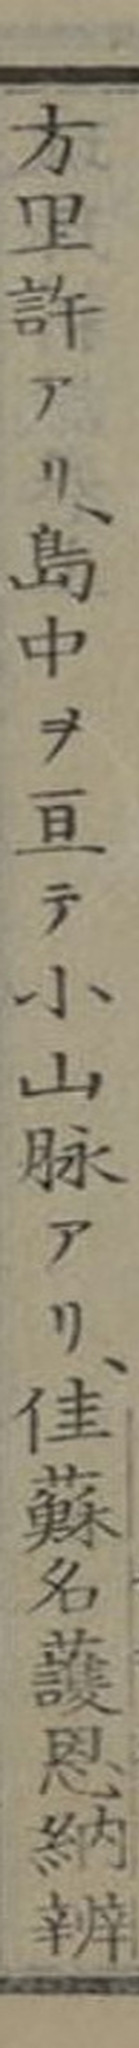方里許アリ、島中ヲ亘テ小山脈アリ、佳蘇名護恩納弁
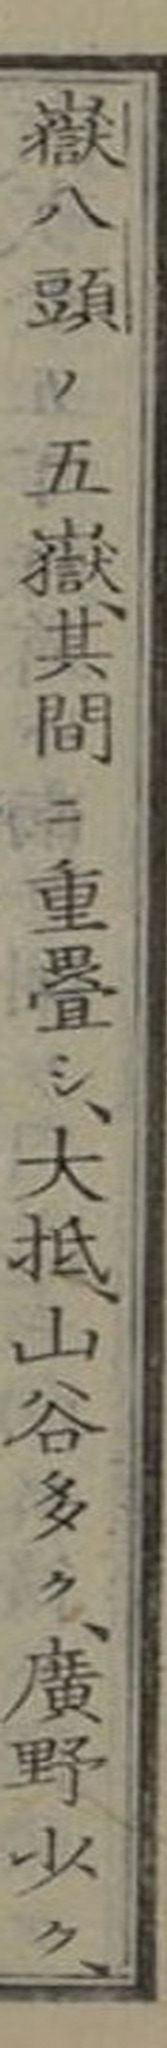岳八頭ノ五岳、其間ニ重畳シ、大抵、山谷多ク、広野少ク、
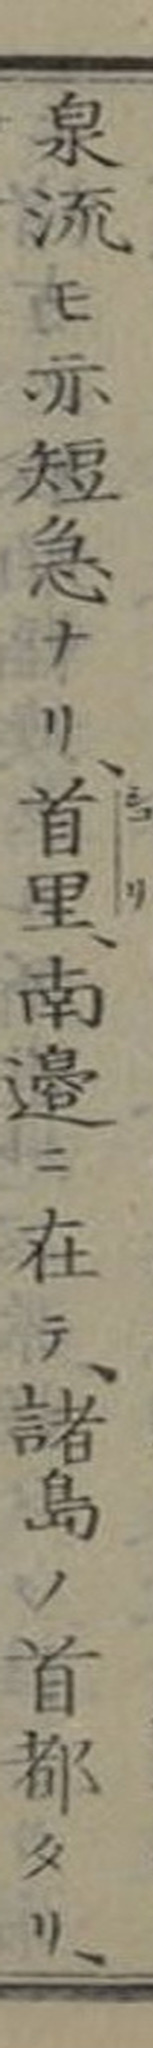泉流モ亦短急ナリ、首里、南辺ニ在テ、諸島ノ首都タリ、
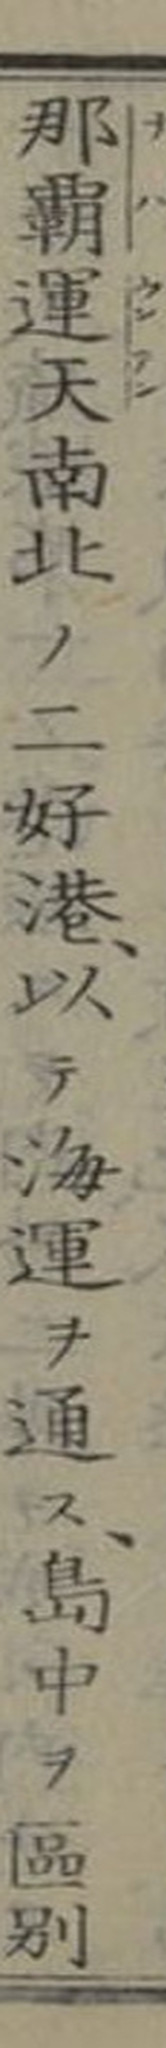那覇運天南北ノ二好港、以テ海運ヲ通ス、島中ヲ区別
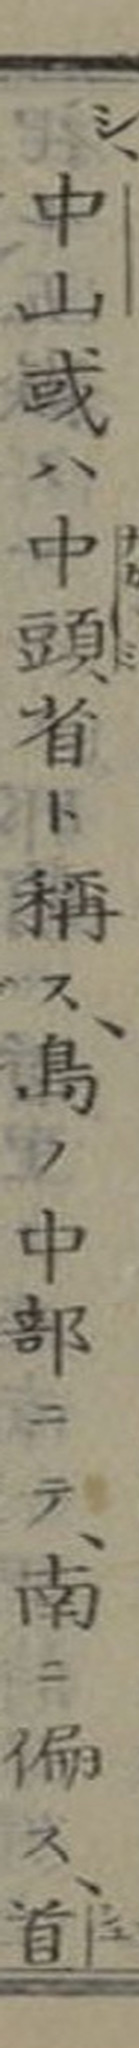シ、中山或ハ中頭省ト称ス、島ノ中部ニテ、南ニ偏ス、首
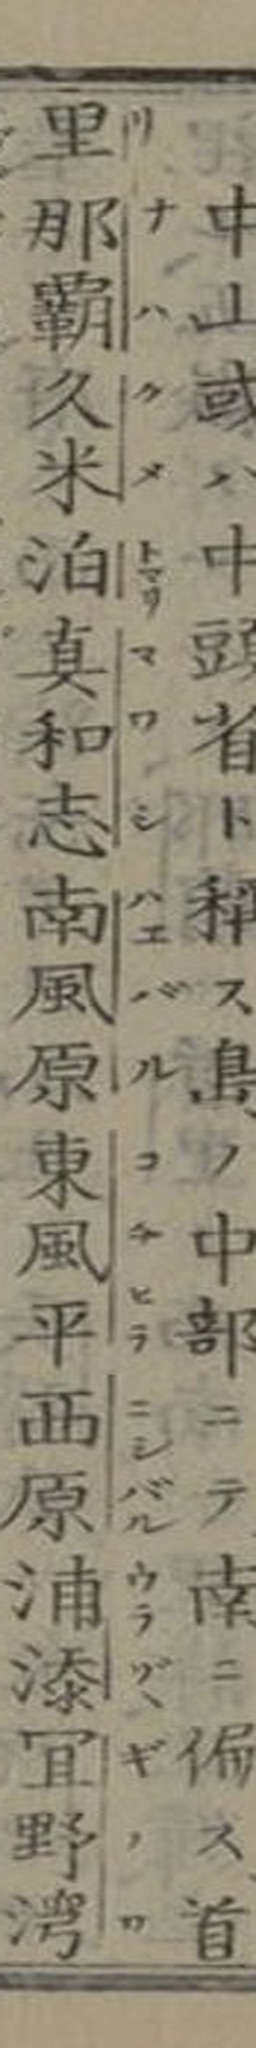里那覇久米泊真和志南風原東風平西原浦添宜野湾
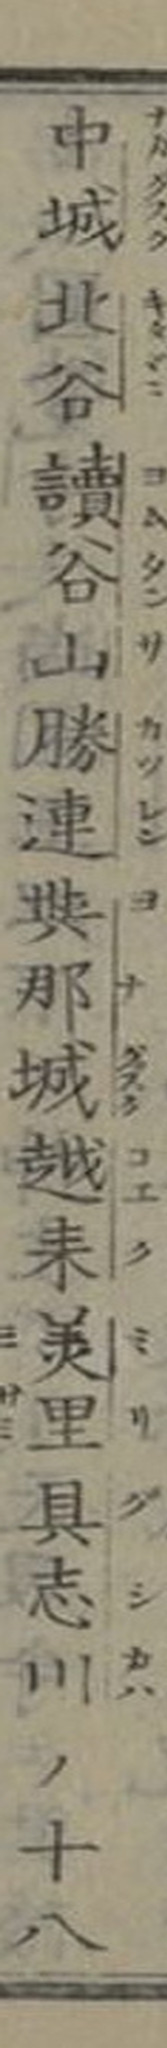中城北谷読谷山勝連与那城越来美里具志川ノ十八
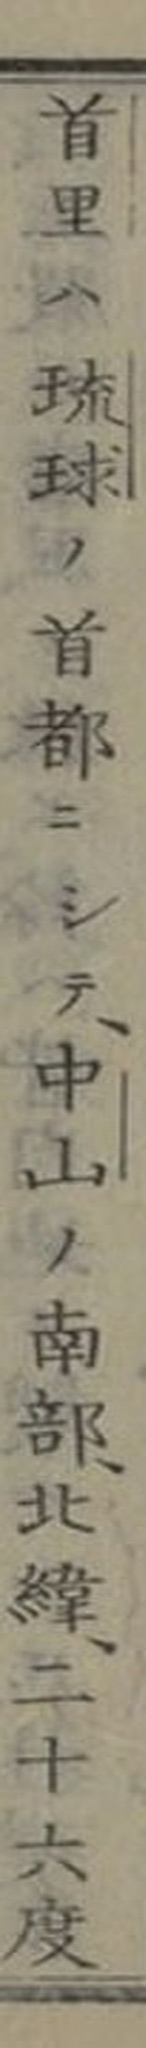首里ハ琉球ノ首都ニシテ、中山ノ南部、北緯、二十六度
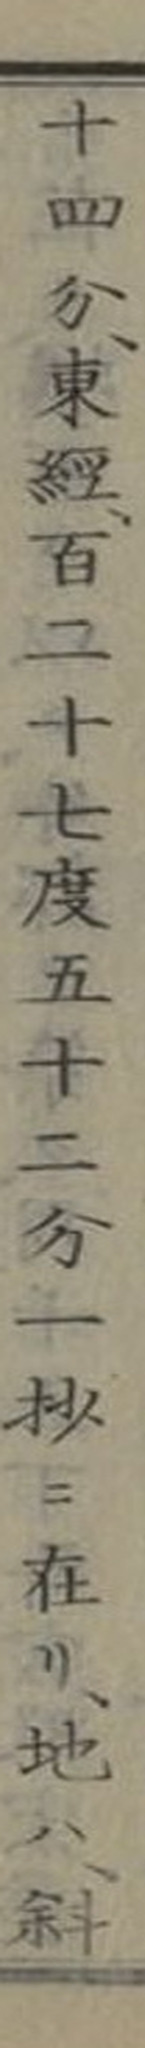十四分、東経、百二十七度五十二分一秒二在リ、地ハ、斜
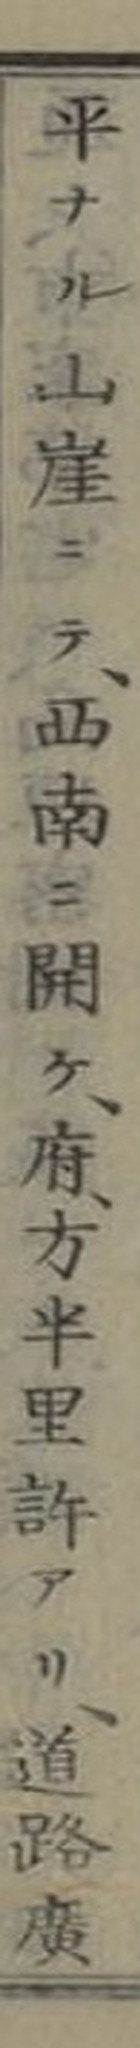平ナル山崖ニテ、西南ニ開ケ、府、方半里許アリ、道路広

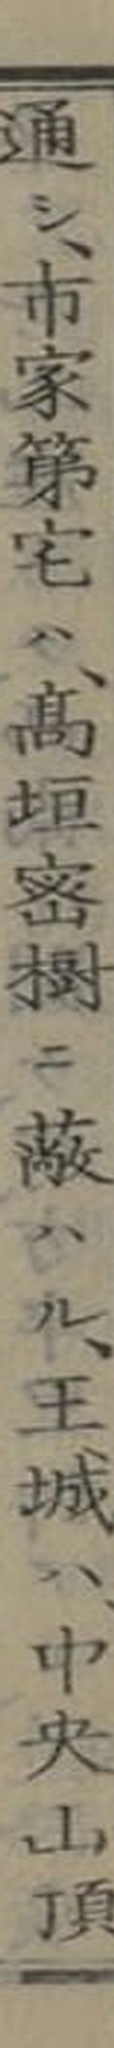通シ、市家第宅ハ、高垣密樹ニ蔽ハル、王城ハ、中央山頂
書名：琉球新誌 図附 上
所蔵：University of the Ryukyus Library
